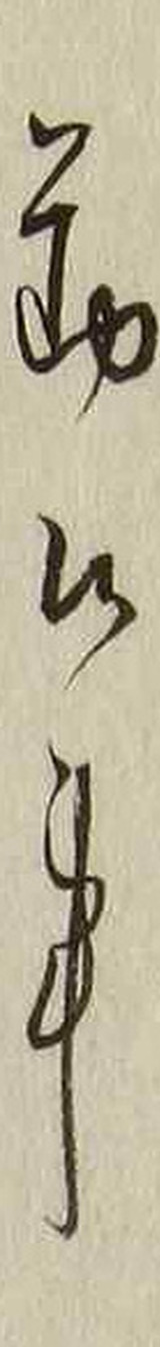勤候事
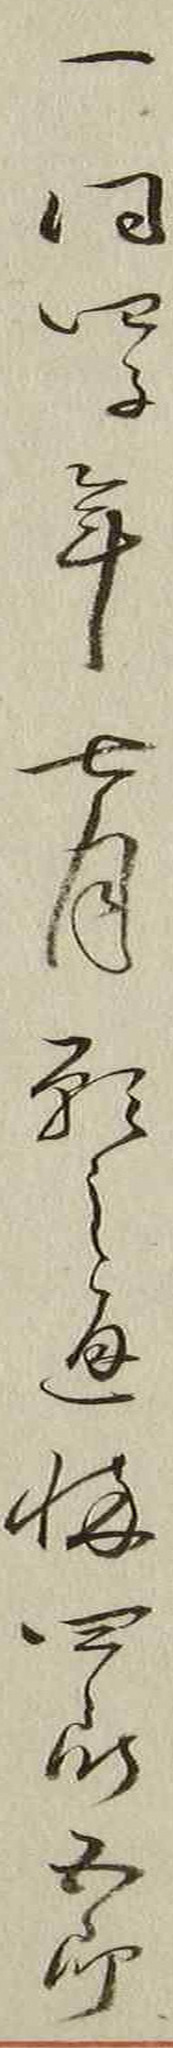一同四子年七月願之通悴四郎五郎
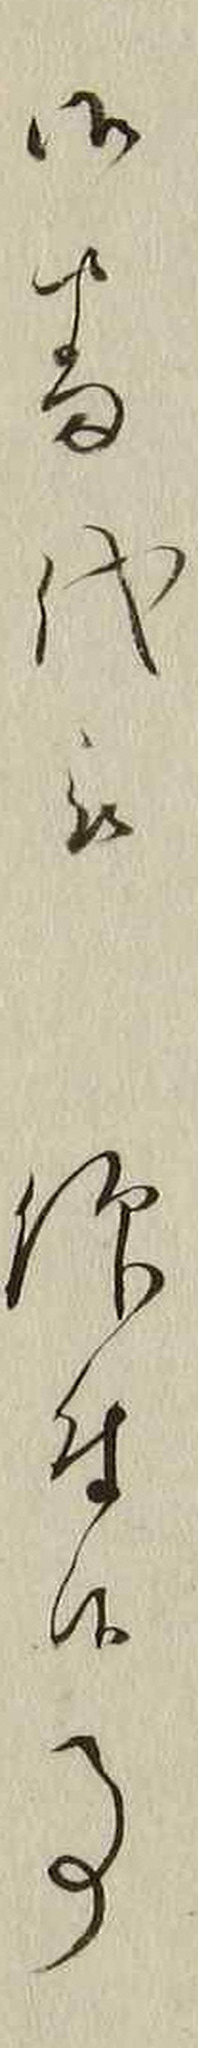御番代被仰付候事
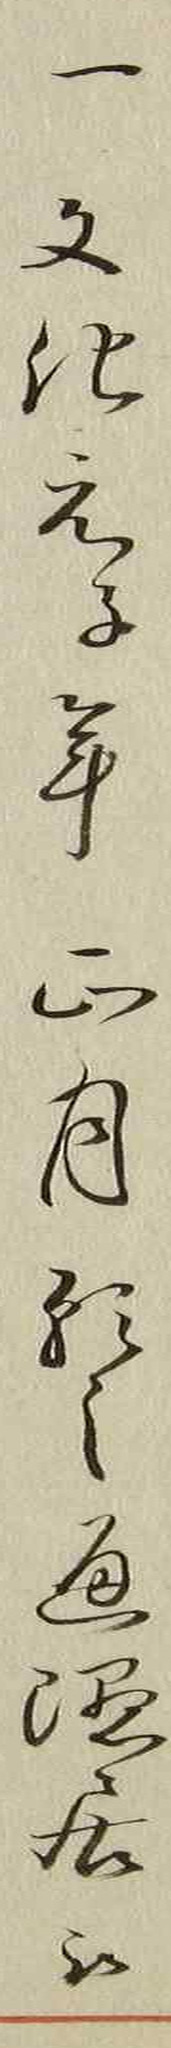一文化元子年正月願之通隠居被
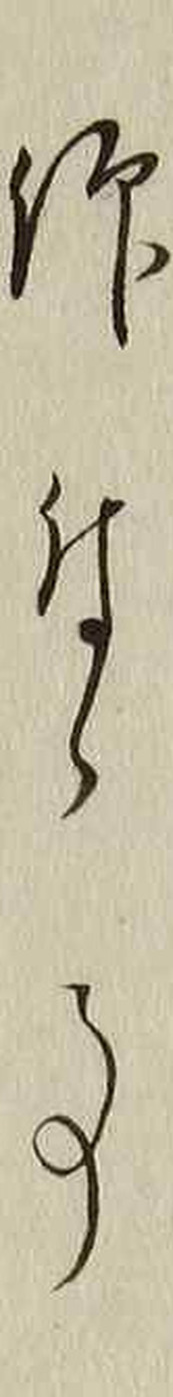仰付候事
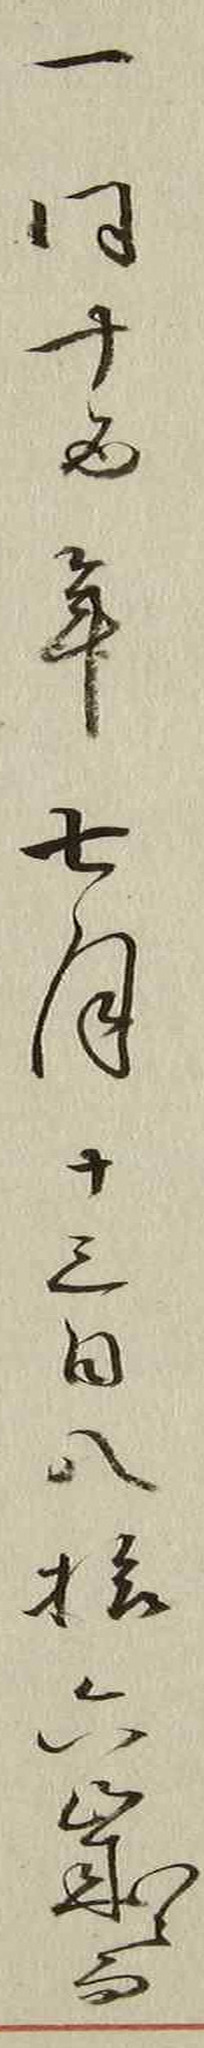一同十酉年七月十三日八拾六歳ニ而
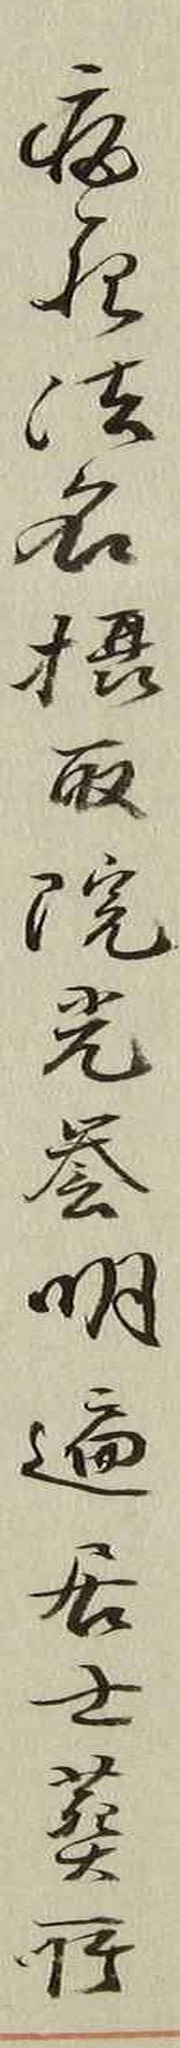病死法名摂取院光誉明遍居士葬所
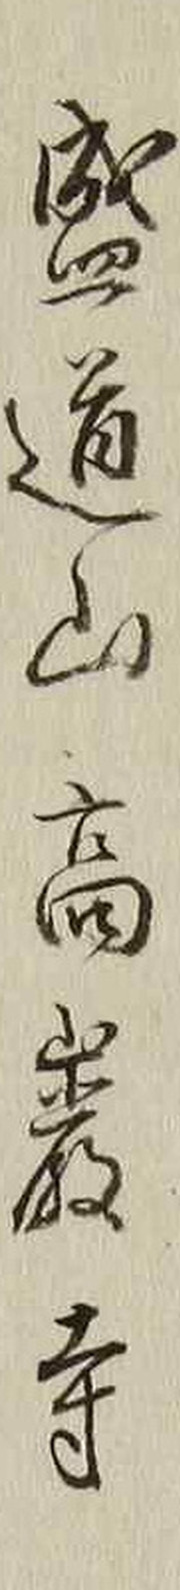盛道山高巌寺
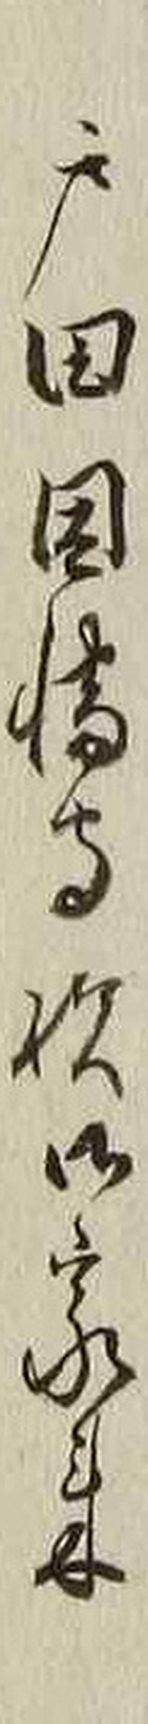女戸田因幡守様御家来
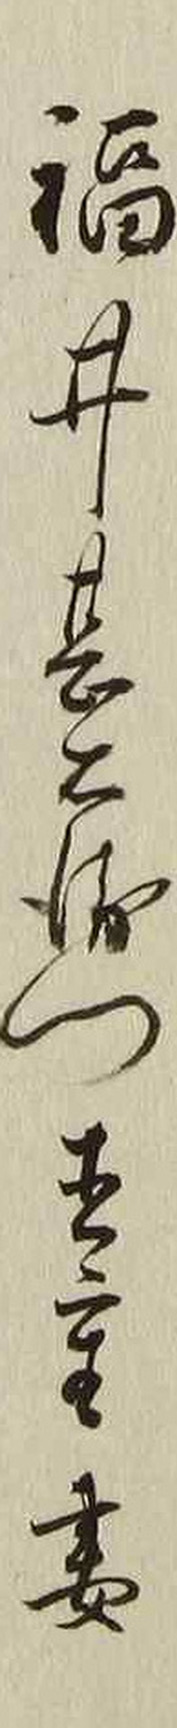福井甚右衛門直重妻
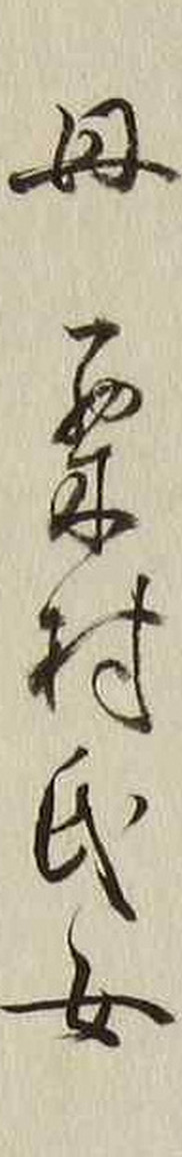母栗村氏女
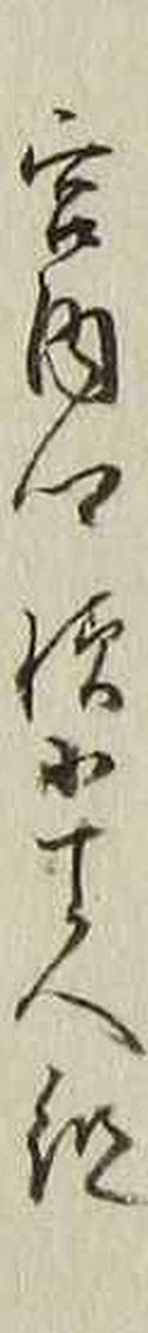女宮内卿様小十人組
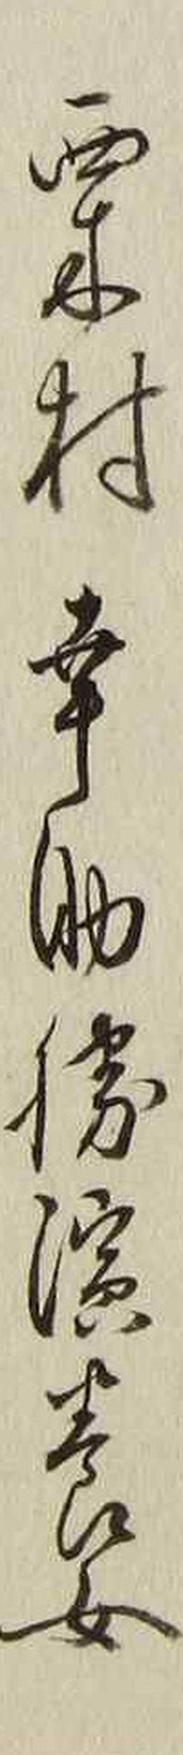栗村幸助勝演養女
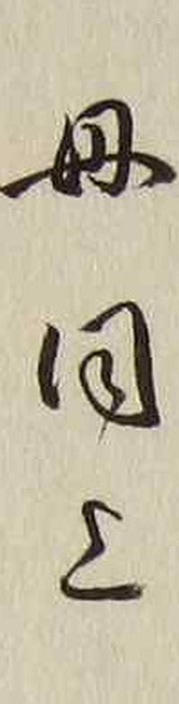母同上

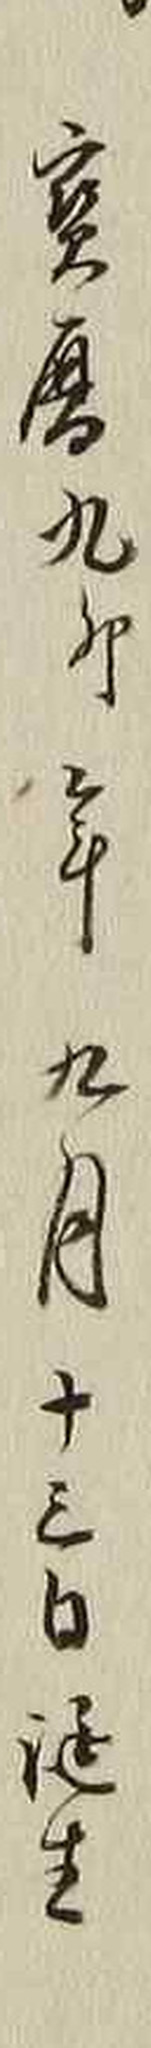宝暦九卯年九月十三日誕生
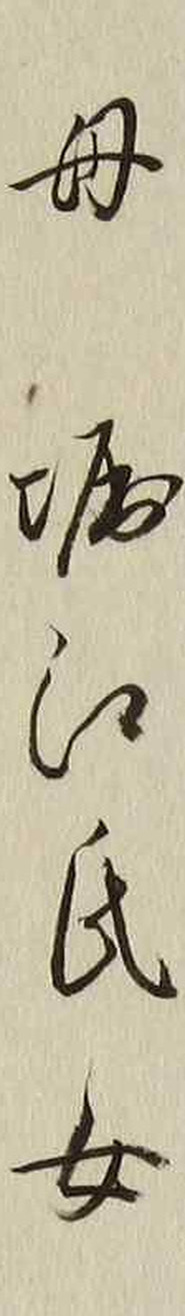母堀江氏女
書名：諸士系譜　巻之28　い之部28
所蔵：会津若松市立会津図書館
